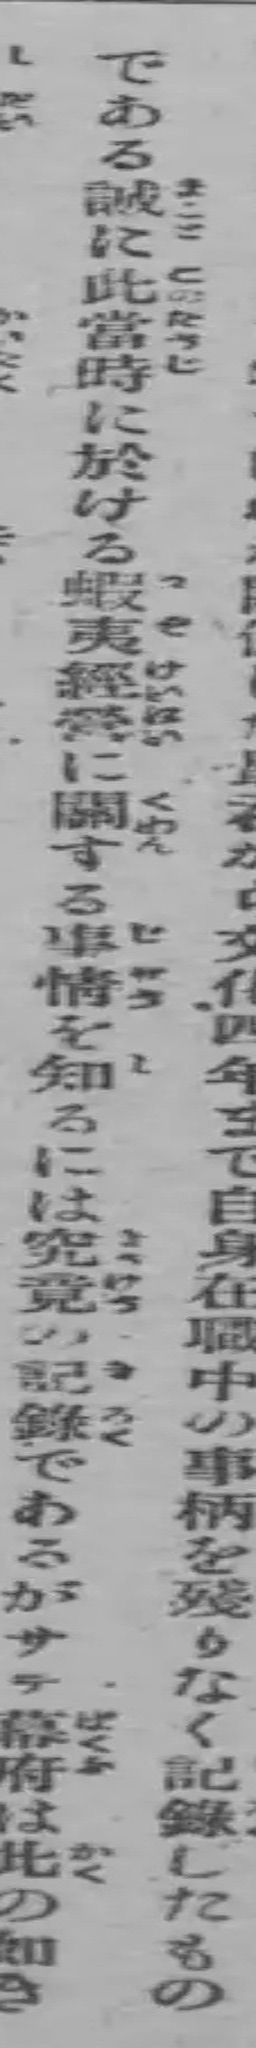である誠に此当時に於ける蝦夷経営に関する事情を知るには究竟の記録であるがサテ幕府は此の如き
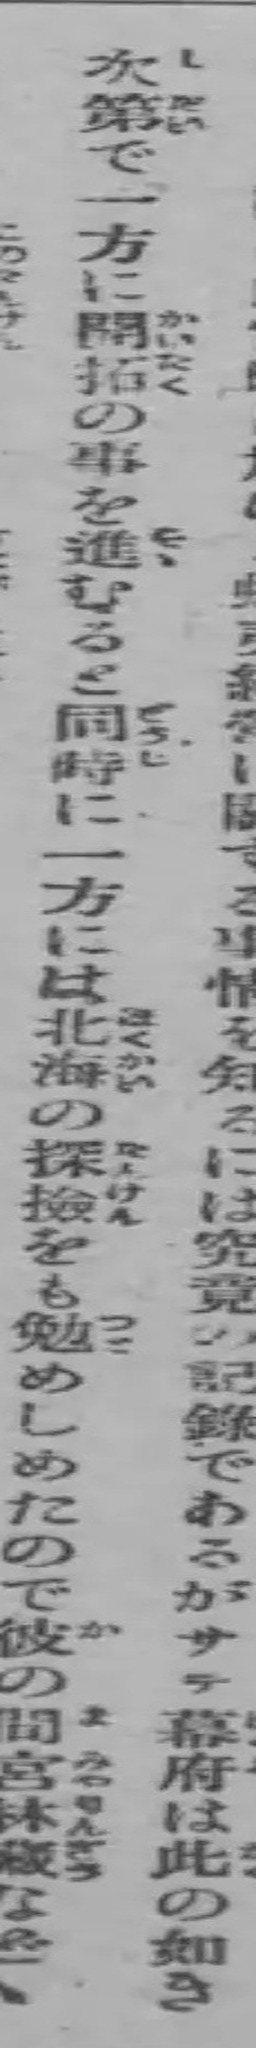間宮林蔵次第で一方に開拓の事を進むると同時に一方には北海の探検をも勉めしめたので彼の間宮林蔵などゝ
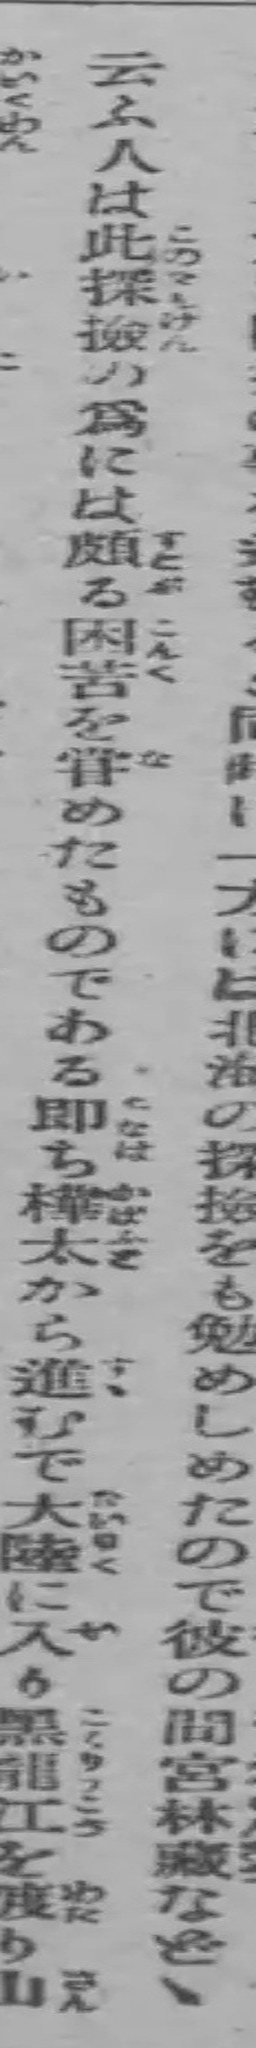云ふ人は此探検の為には頗る困苦を甞めたものである即ち樺太から進むで大陸に入り黒龍江を渡り山
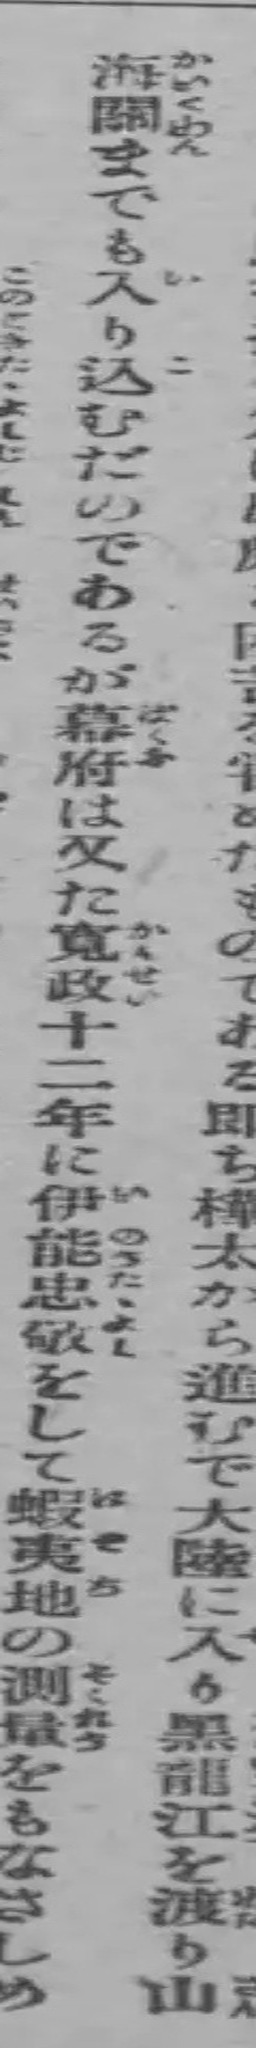海関までも入り込むだのであるが幕府は又た寛政十二年に伊能忠敬をして蝦夷地の測量をもなさしめ
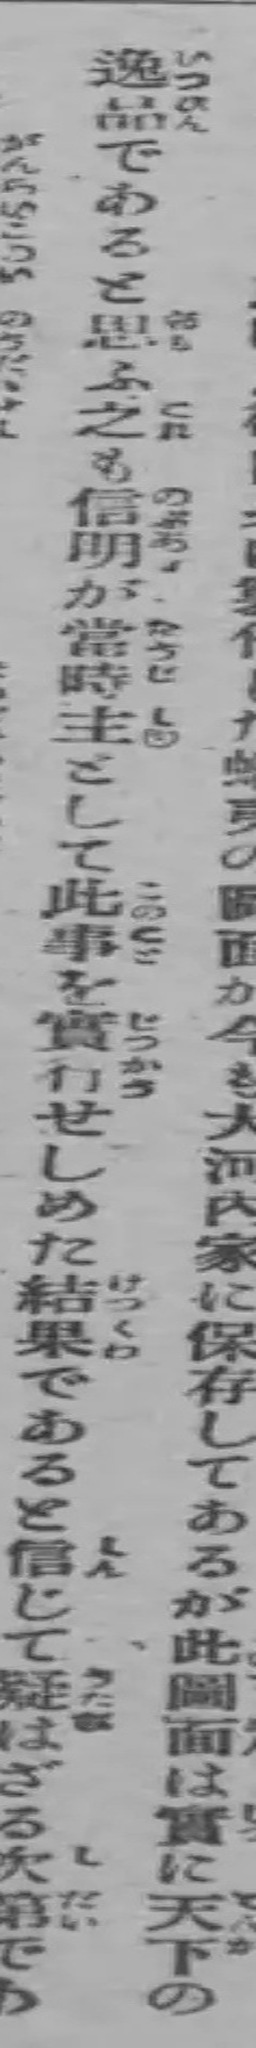逸品であると思ふ之も信明が当時主として此事を実行せしめた結果であると信じて疑はざる次第であ
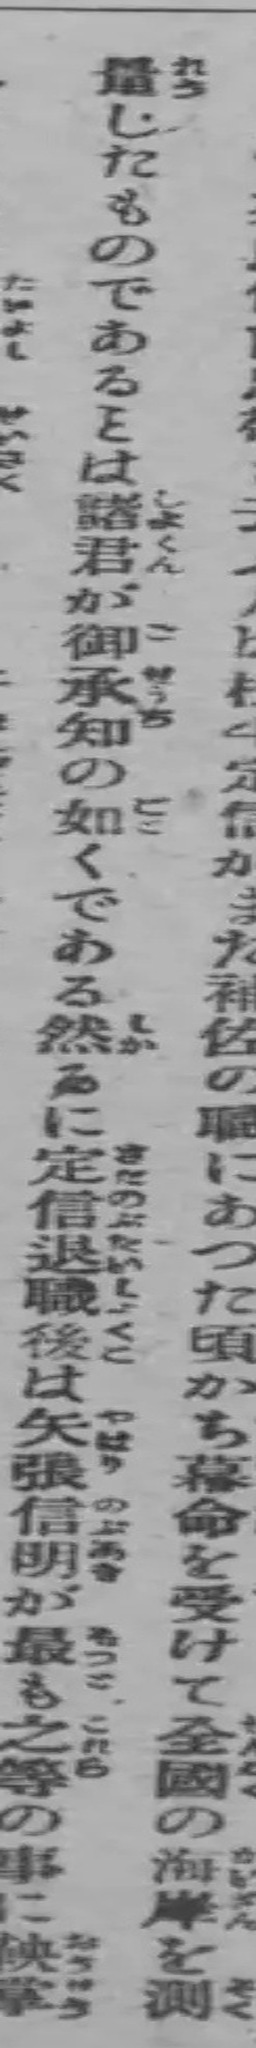量したものであることは諸君が御承知の如くである然るに定信退職後は矢張信明が最も之等の事に鞅掌
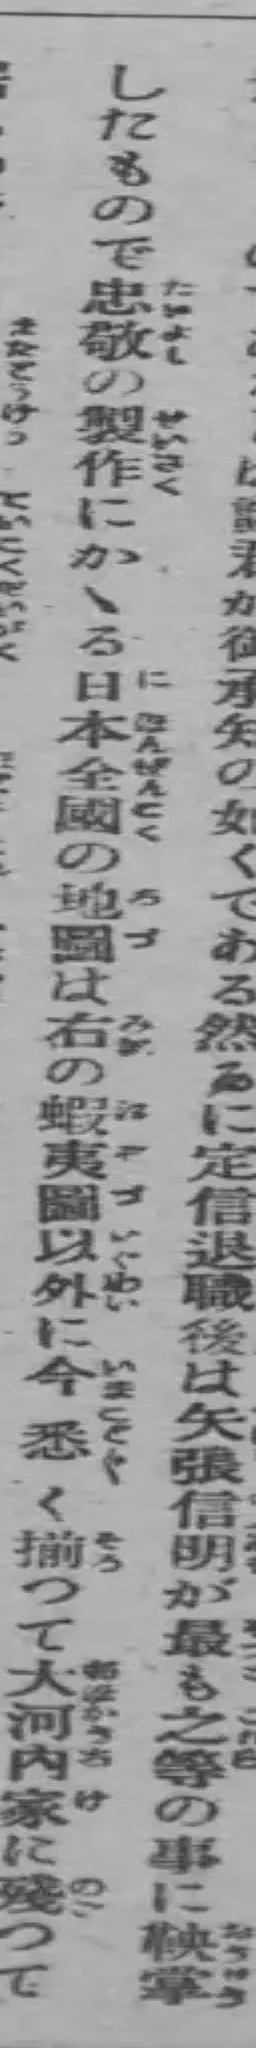したもので忠敬の製作にかゝる日本全国の地図は右の蝦夷図以外に今悉く揃つて大河内家に残つて
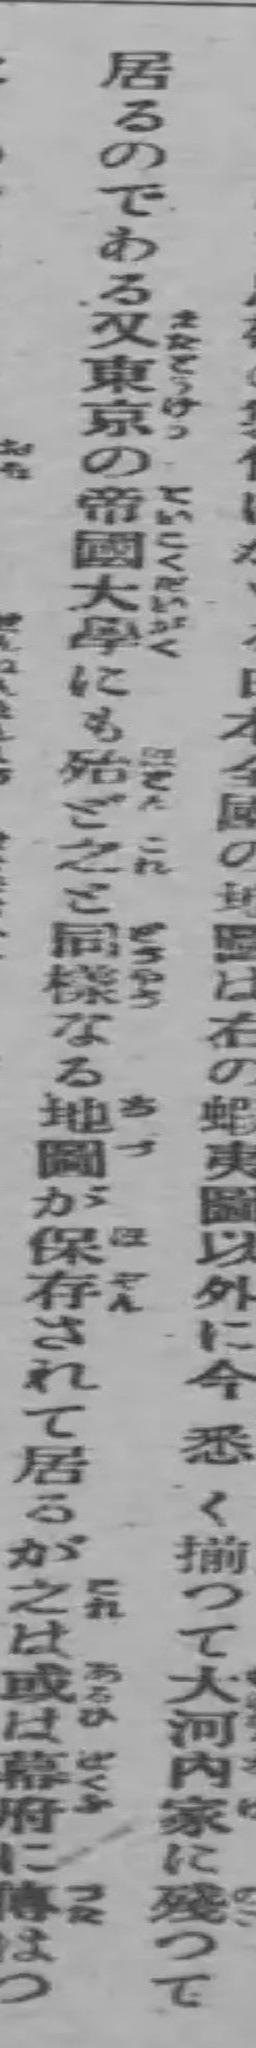居るのである又東京の帝国大学にも殆ど之と同様なる地図が保存されて居るが之は或は幕府に伝はつ
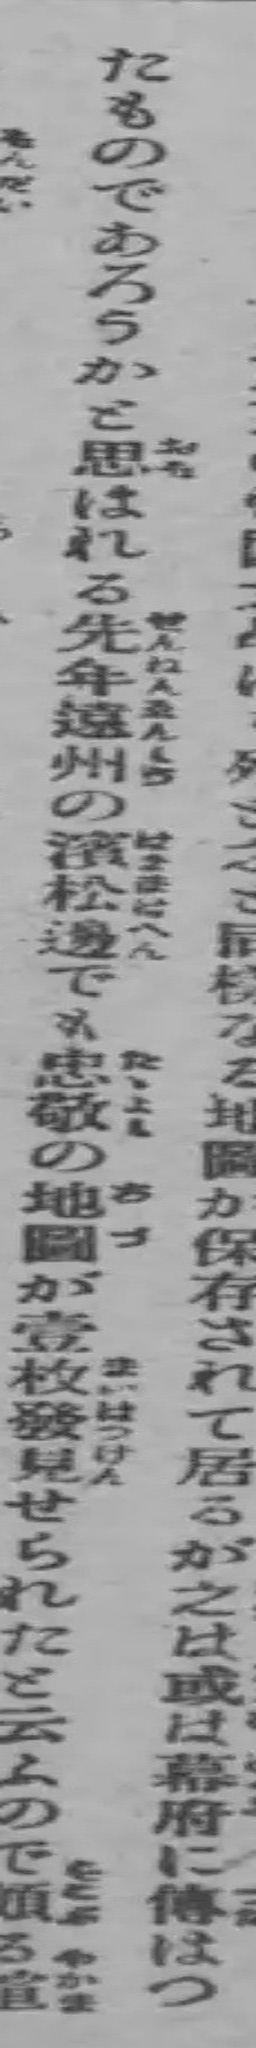たものであろうかと思はれる先年遠州の浜松辺でも忠敬に地図が壱枚発見せられたと云ふので頗る喧
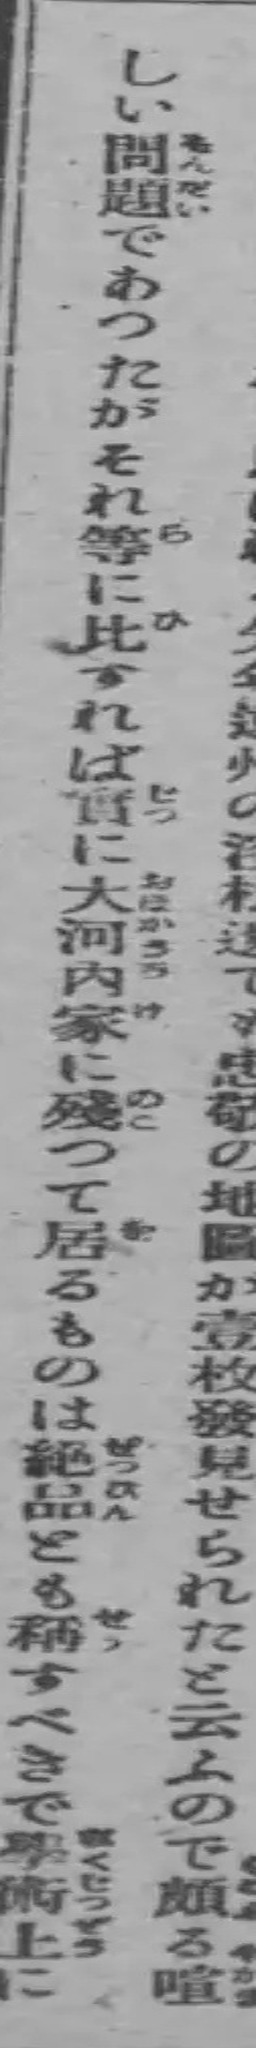しい問題であつたがそれ等に比すれば実に大河内家に残つて居るものは絶品とも称すべきで学術上に
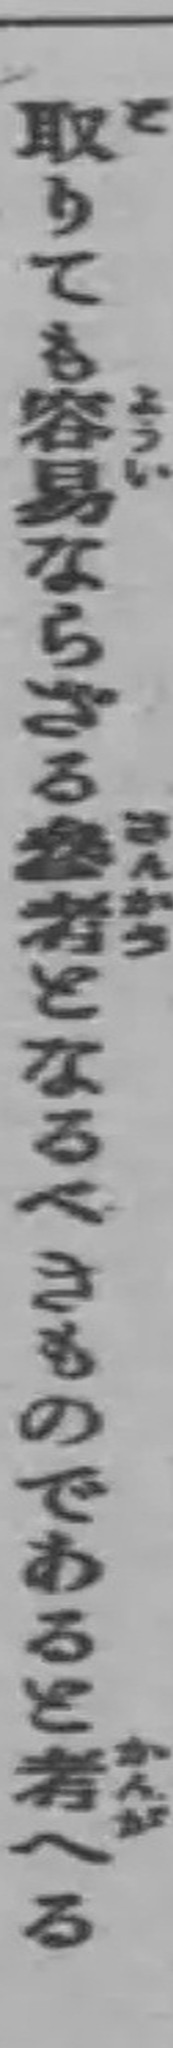取りても容易ならざる参考となるべきものであると考へる
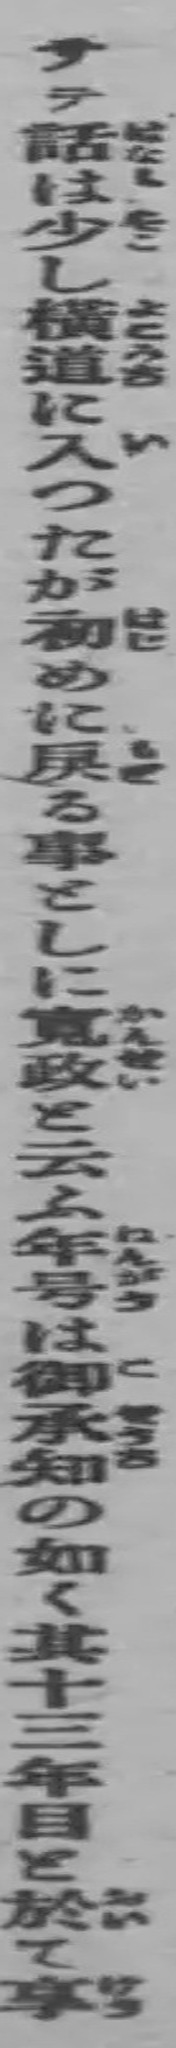サテ話は少し横道に入つたが初めに戻る事として寛政と云ふ年号は御承知の如く其十三年目と於て享
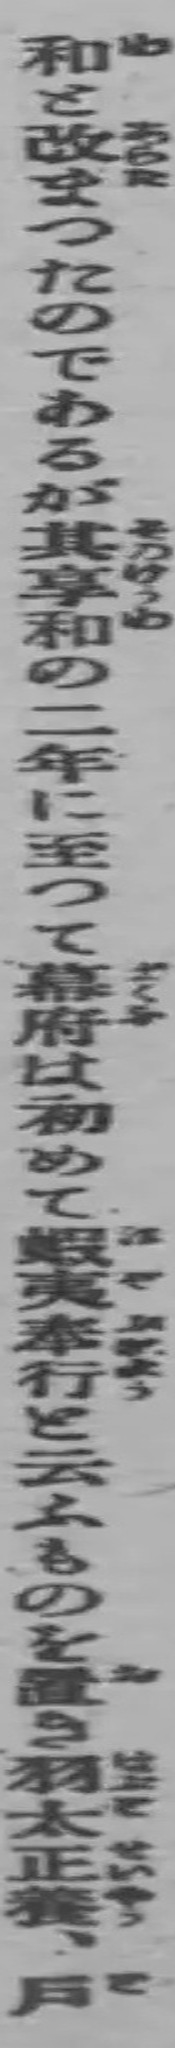蝦夷奉行和と改まつたのであるが其享和の二年に至つて幕府は初めて蝦夷奉行と云ふものを置き羽太正養、戸
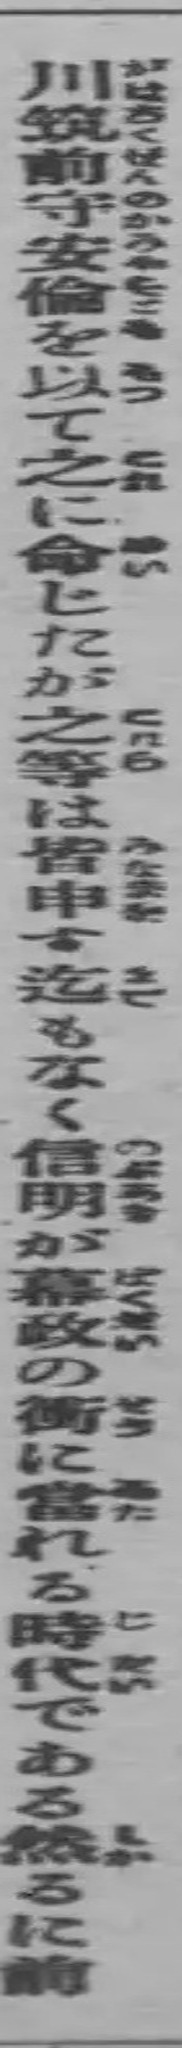川筑前守安倫を以て之に命じたが之等は皆申す迄もなく信明が幕政の衝に当れる時代である然るに前
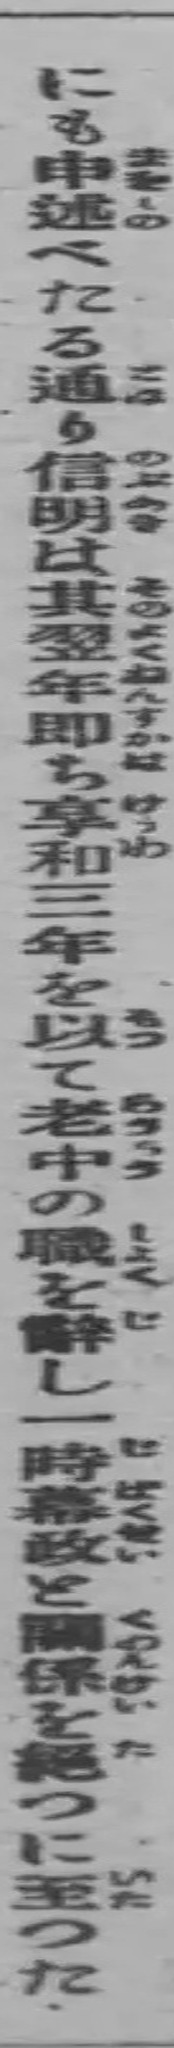にも申述べたる通り信明は其翌年即ち享和三年を以て老中の職を辞し一時幕政と関係を絶つに至つた
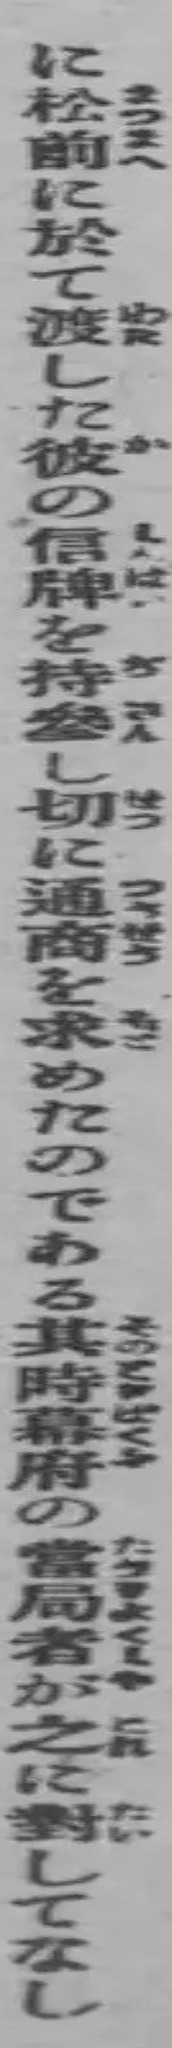に松前に於て渡した彼の信牌を持参し切に通商を求めたのである其時幕府の当局者が之に対してなし
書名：豊橋市史談
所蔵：国立国会図書館 National Diet Library, JAPAN
